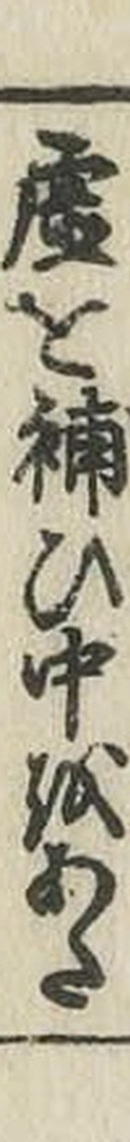虚を補ひ中をあた
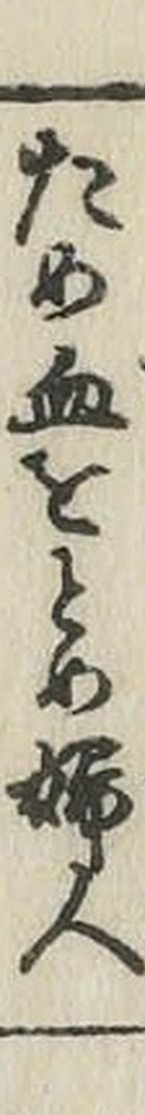ため血をとめ婦人
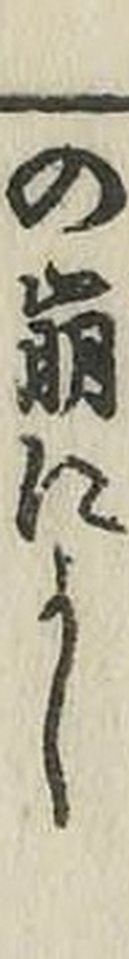の崩によし
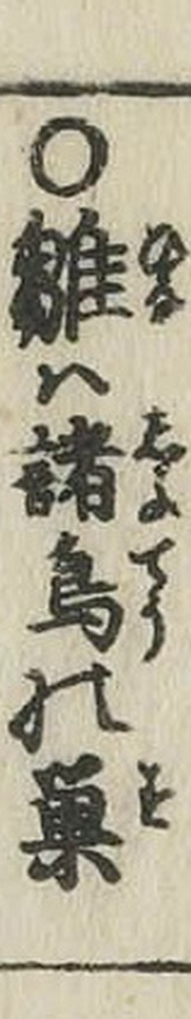○雛は諸鳥の巣
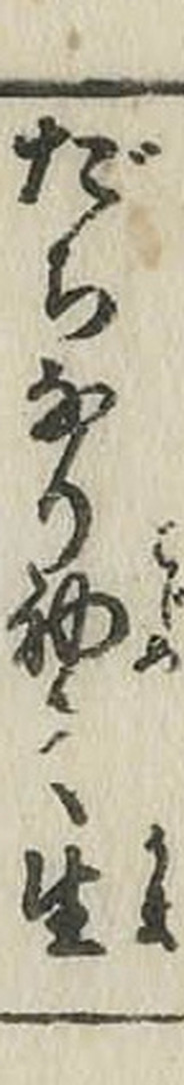だちなり初て生
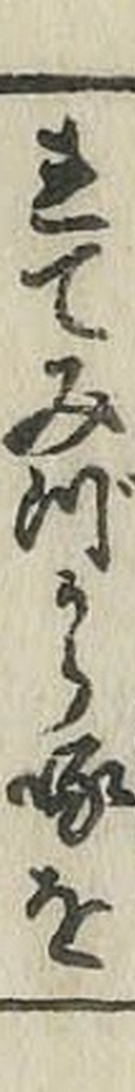れてみづから啄を
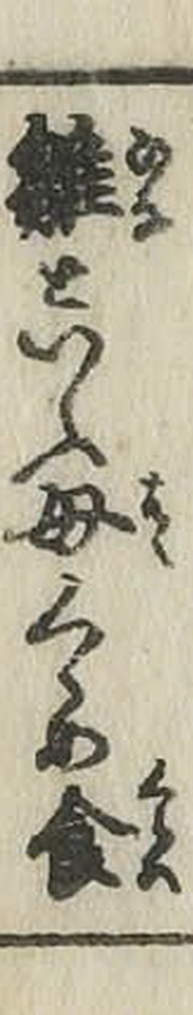雛といふ母くゝめ食
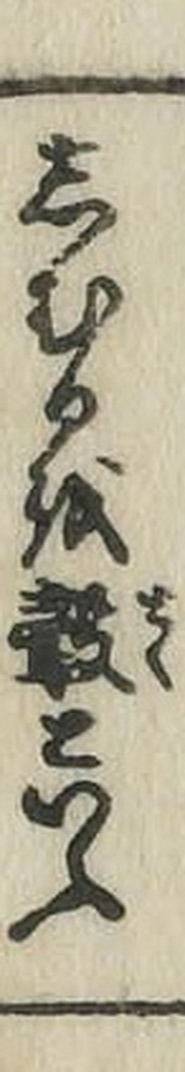しむるを鷇といふ

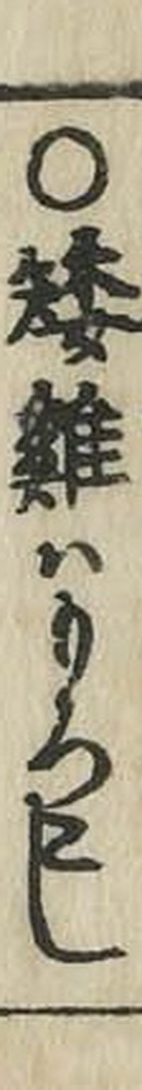○矮鶏はもろこし
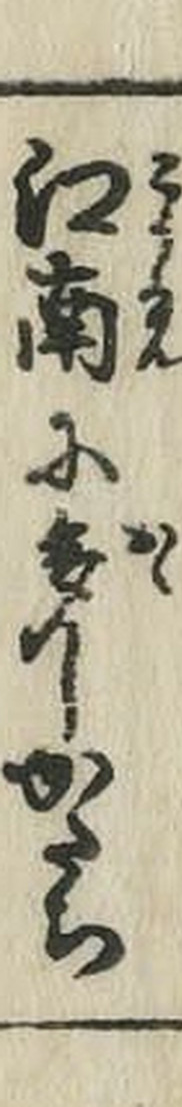江南に多しかたち
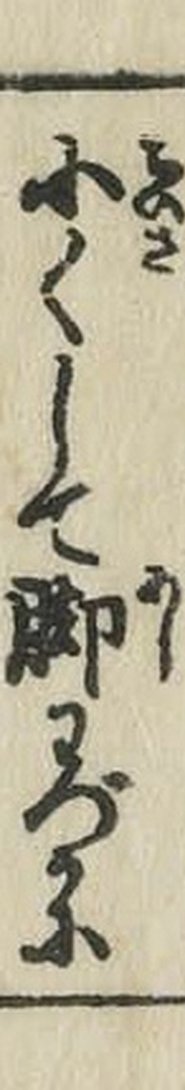小くして脚わづかに
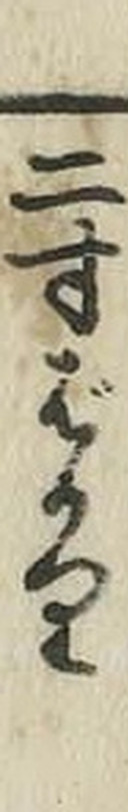二寸ばかり
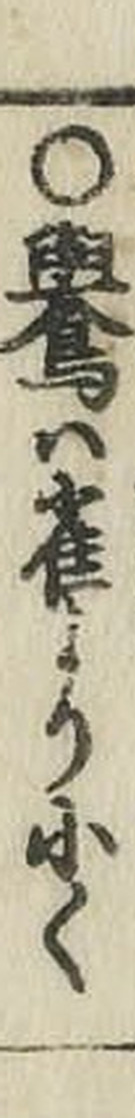○鷽は雀より小く
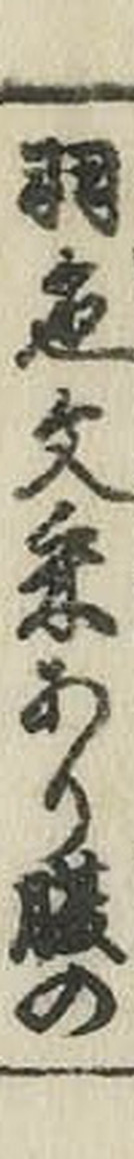羽色文采あり腹の
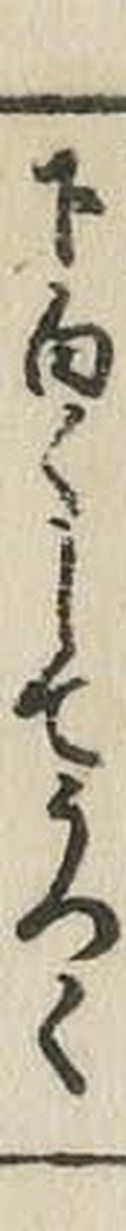下白くしてうつく
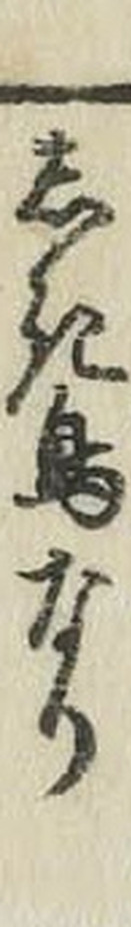しき鳥なり
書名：増補頭書訓蒙図彙大成 10巻 6:巻之12-13
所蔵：東京学芸大学教育コンテンツアーカイブ
